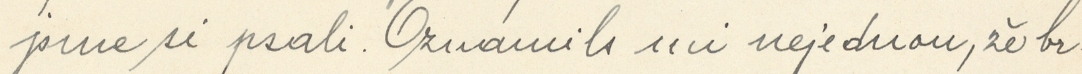jsme si psali. Oznámils mi nejednou, že br-
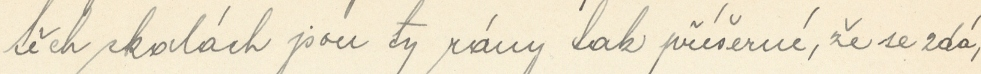těch skalách jsou ty rány tak příšerné, že se zdá,
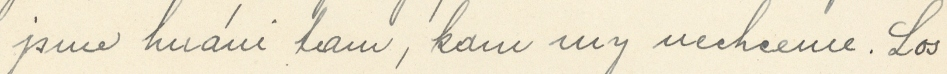jsme hnáni tam, kam my nechceme. Los
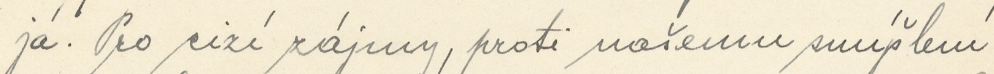já. Pro cizí zájmy, proti našemu smýšlení
